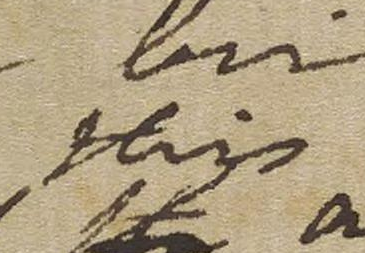this
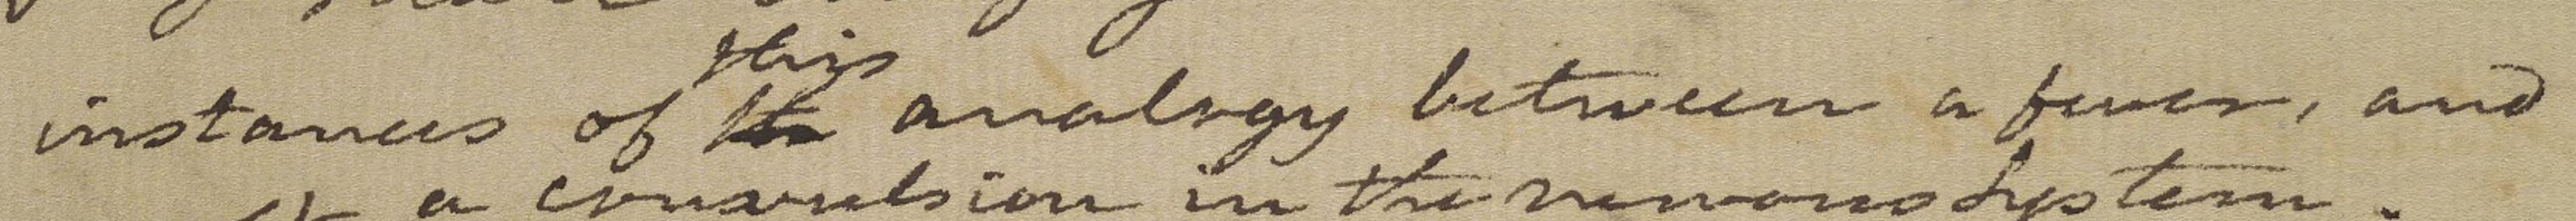instances of [the] analogy between a fever, and
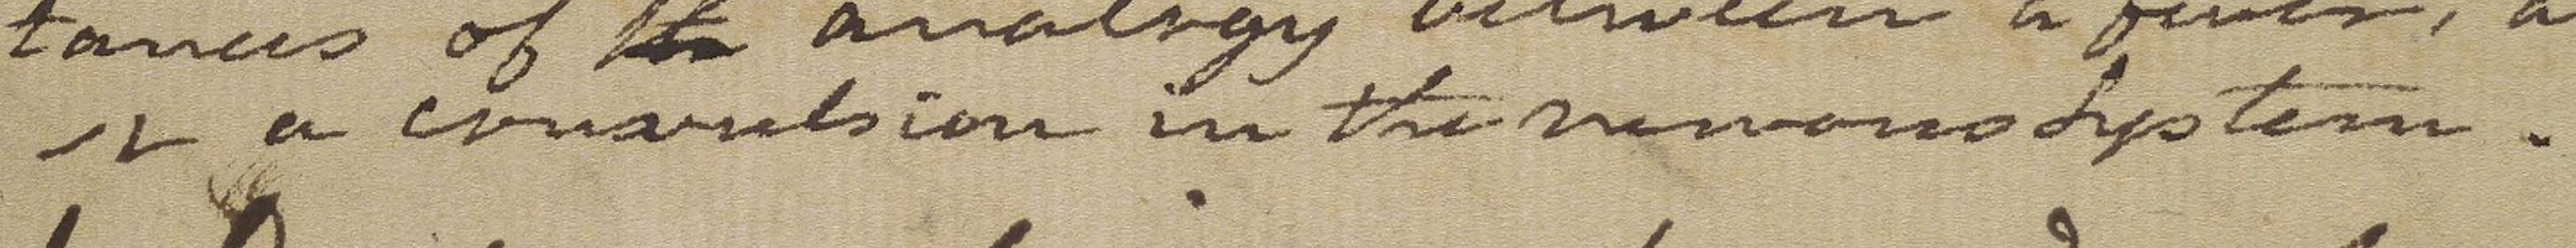IV a convulsion in the nervous system.
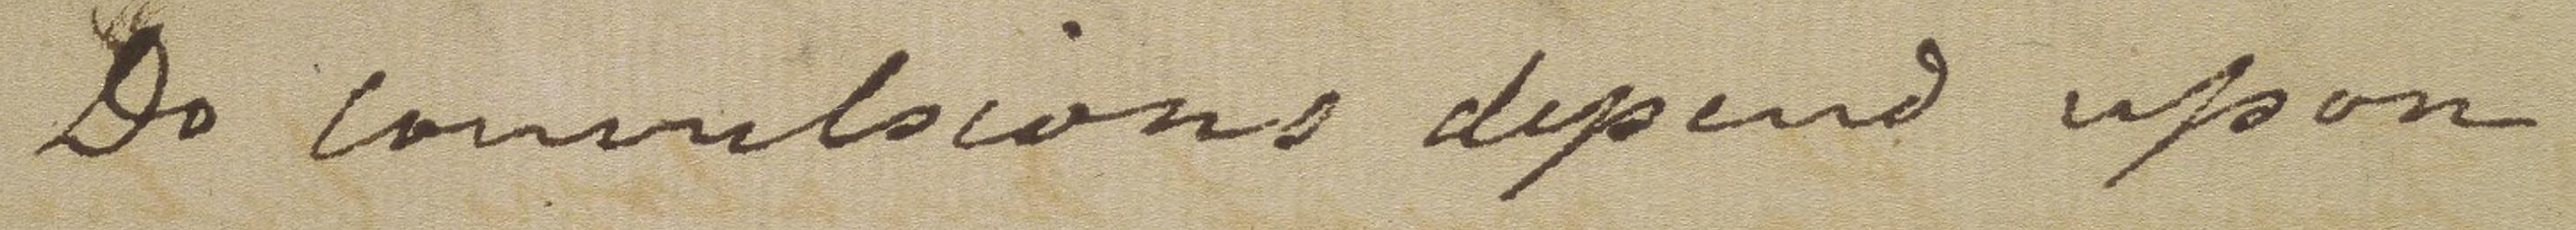Do convulsions depend upon
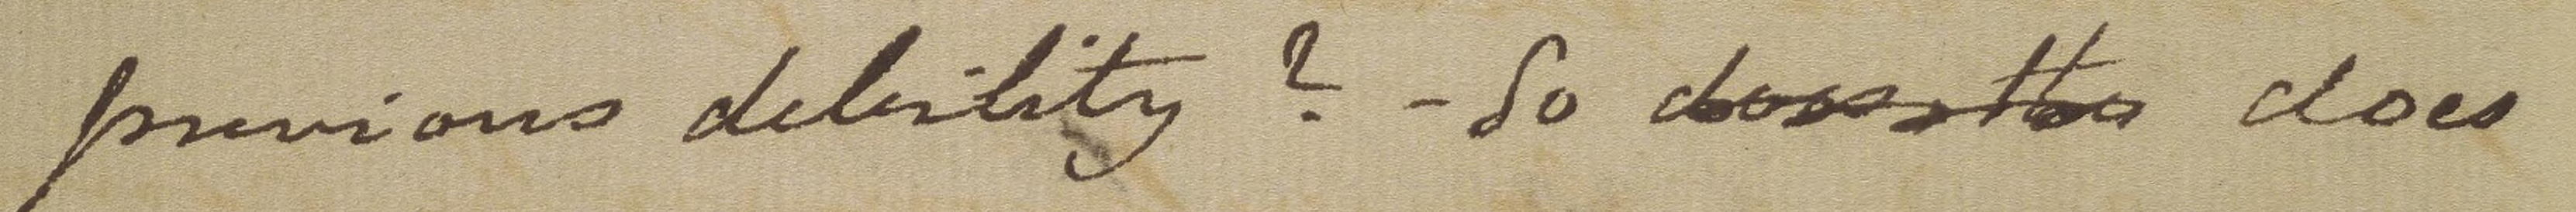previous debility? So [does the] does
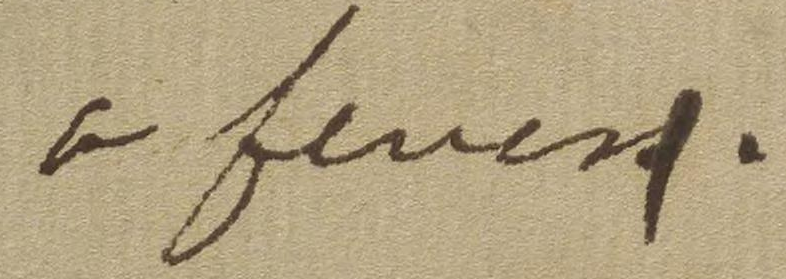a fever.
